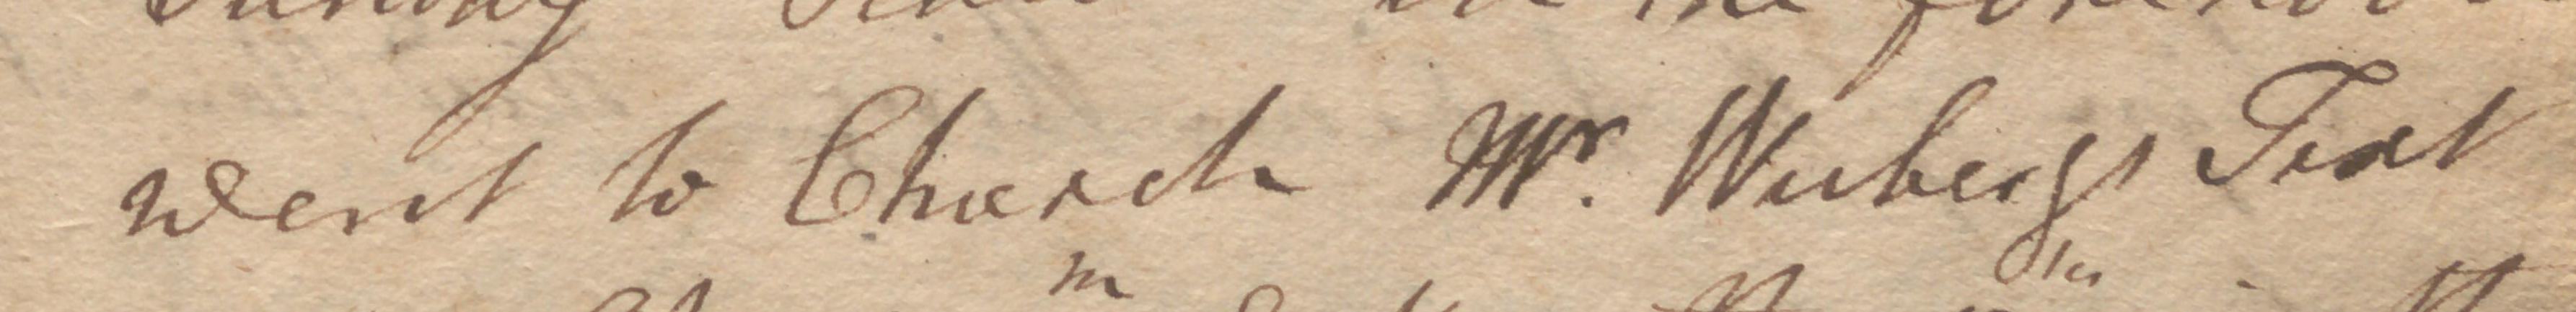went to Church M^r. Weibergs Text
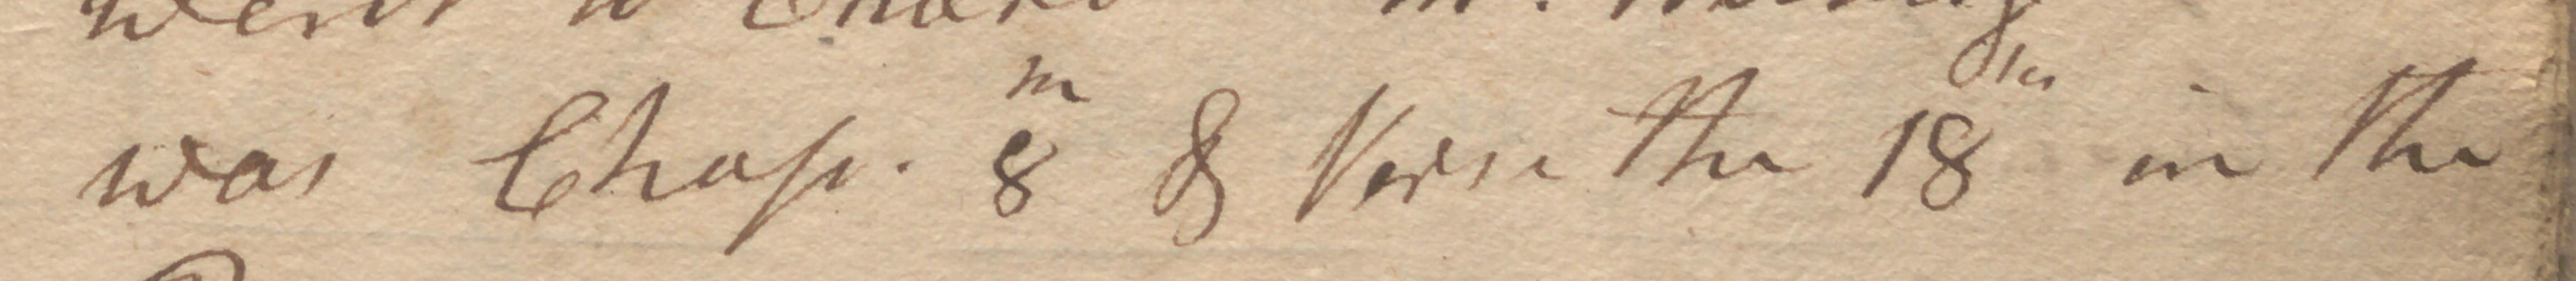was Chap. 8^th & Verse the 18^th in the
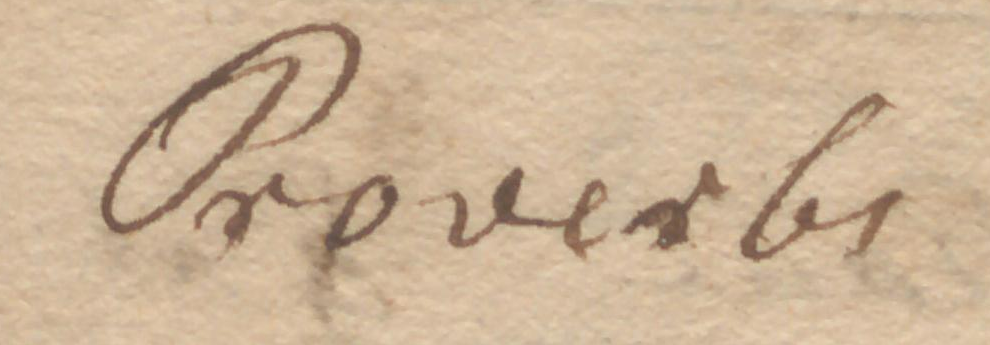Proverbs
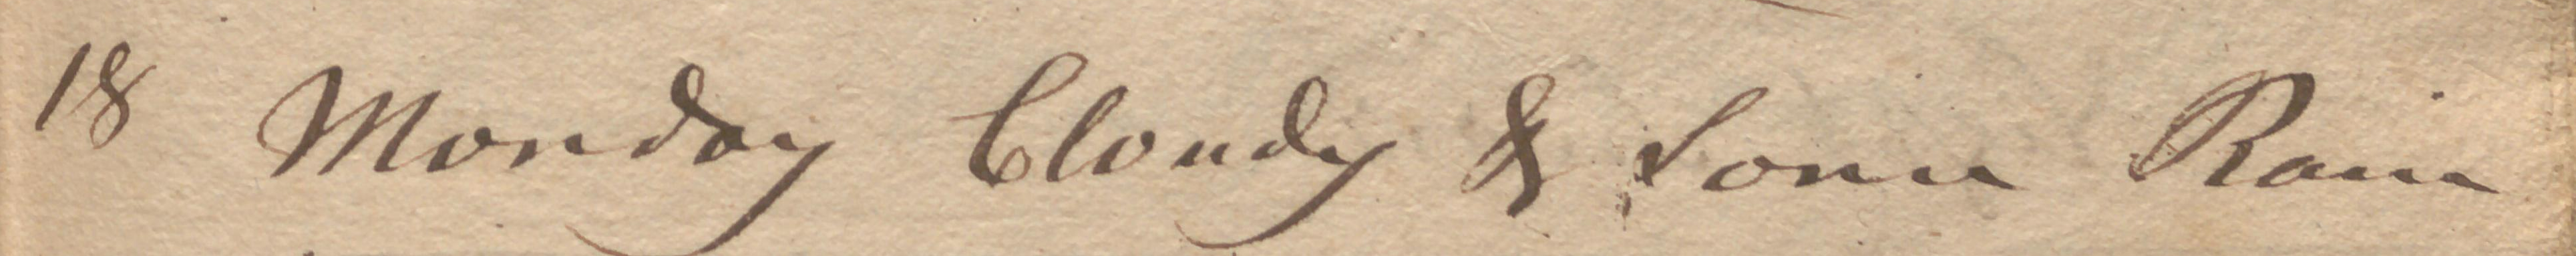18 Monday Cloudy & some Rain
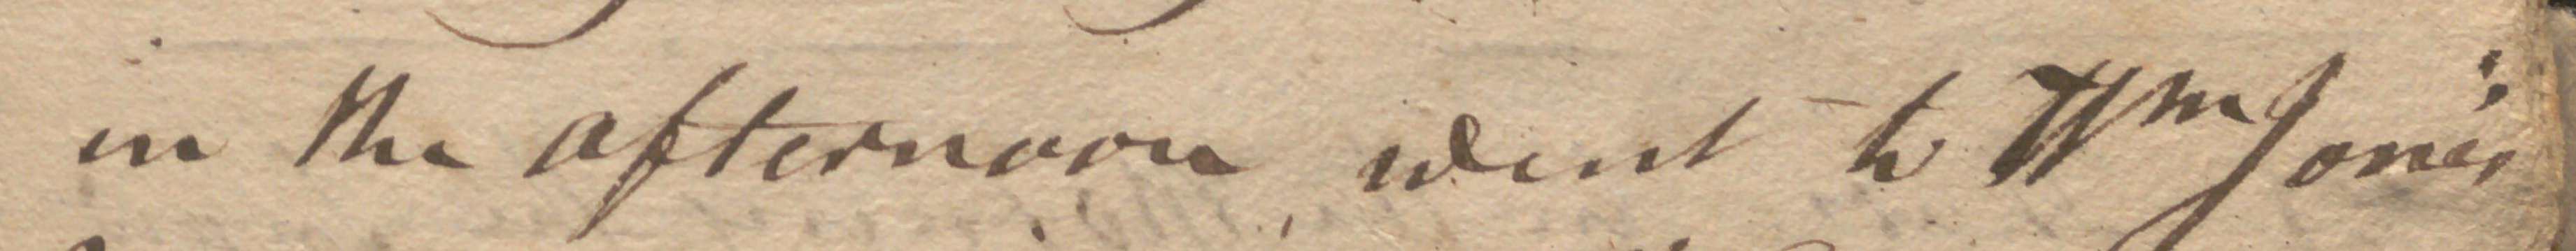in the afternoon went to W^m. Jone's
